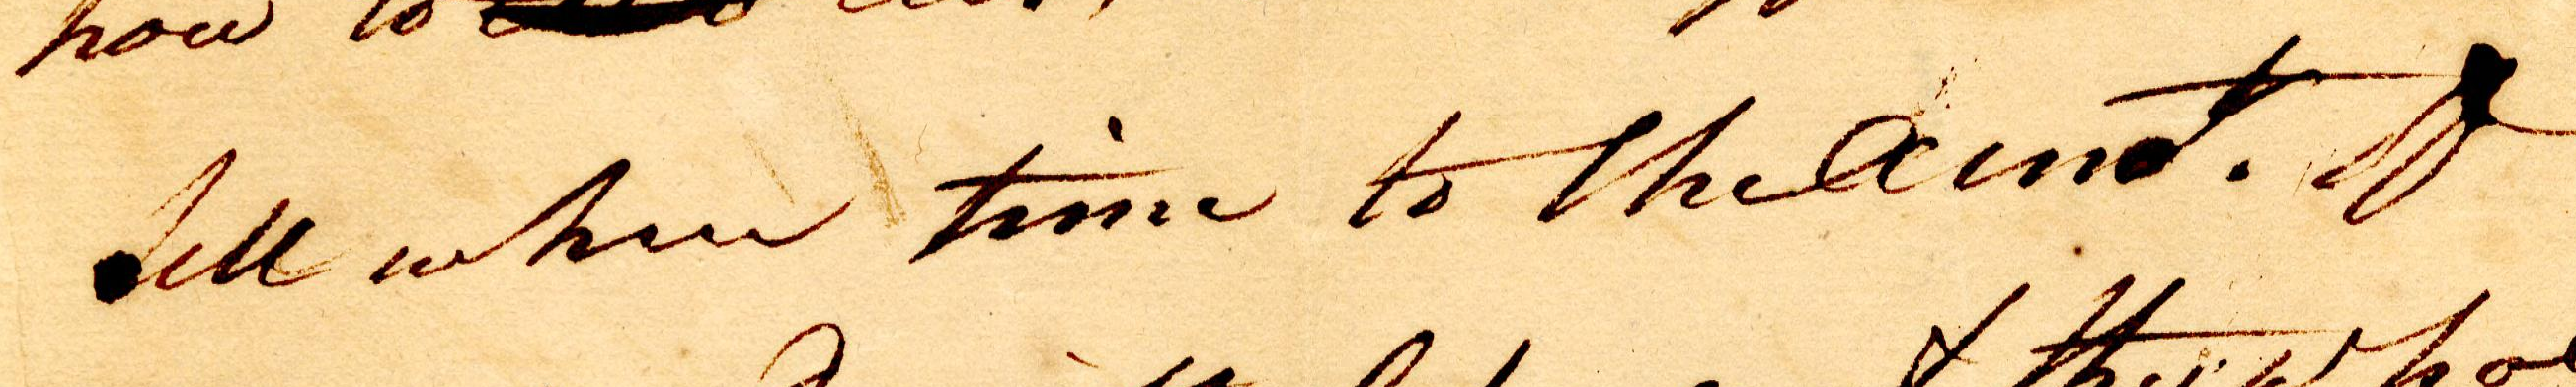sell when time to the acco^t. of
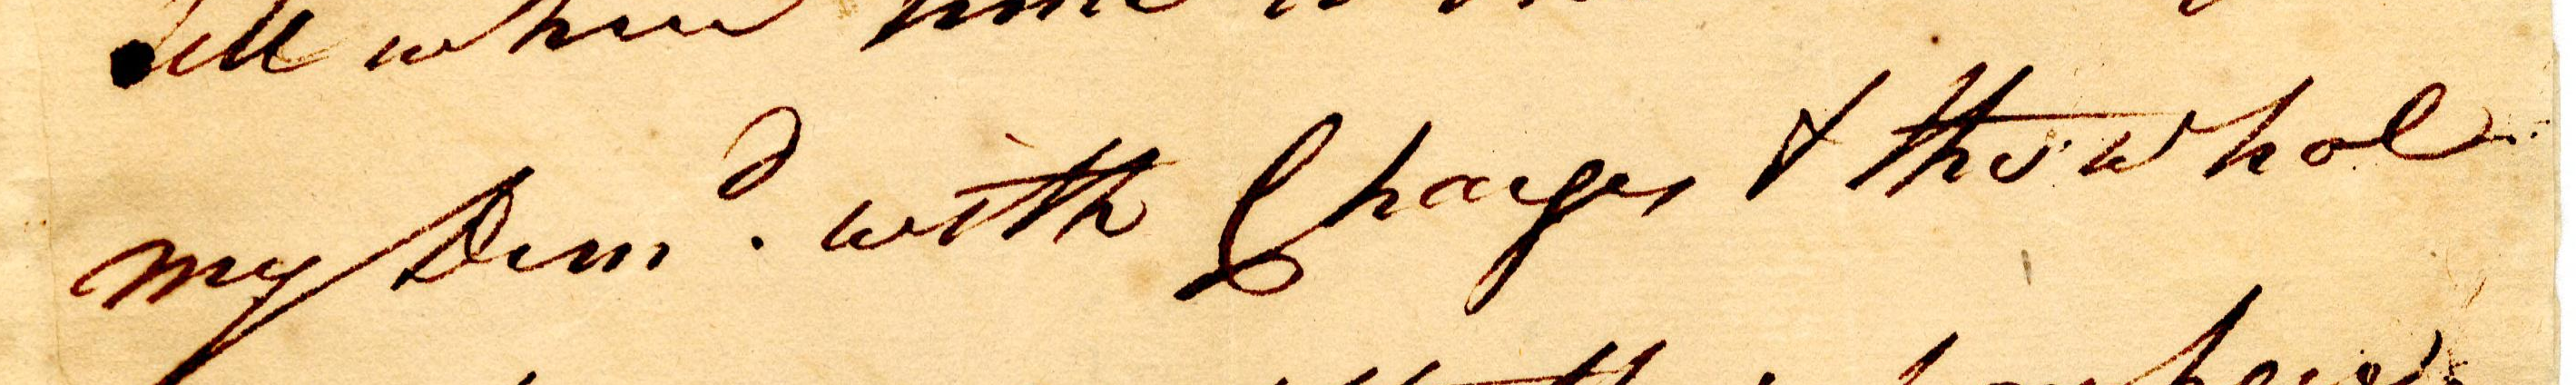my Dem^d. with Charges & the whole
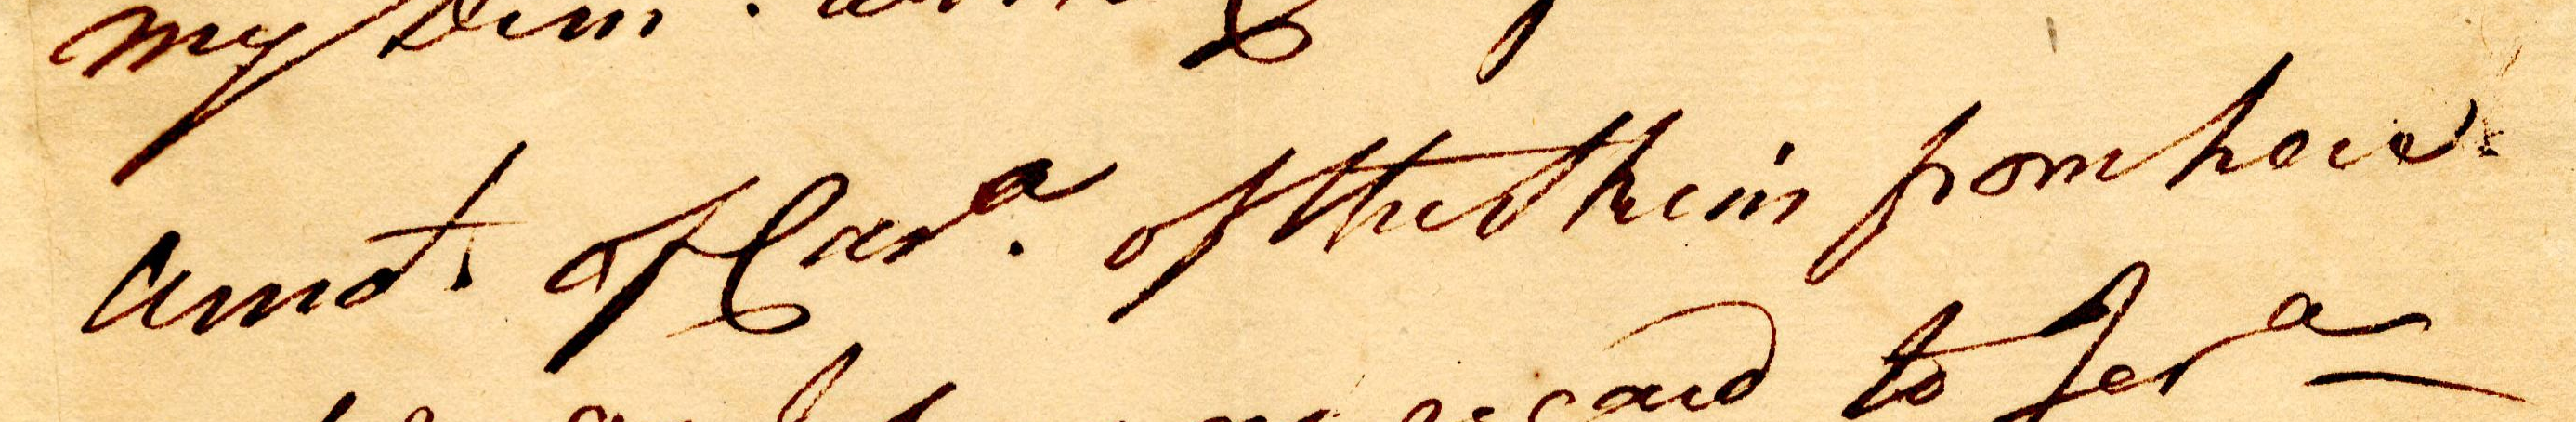amo^t of Cas^a. of that him from here
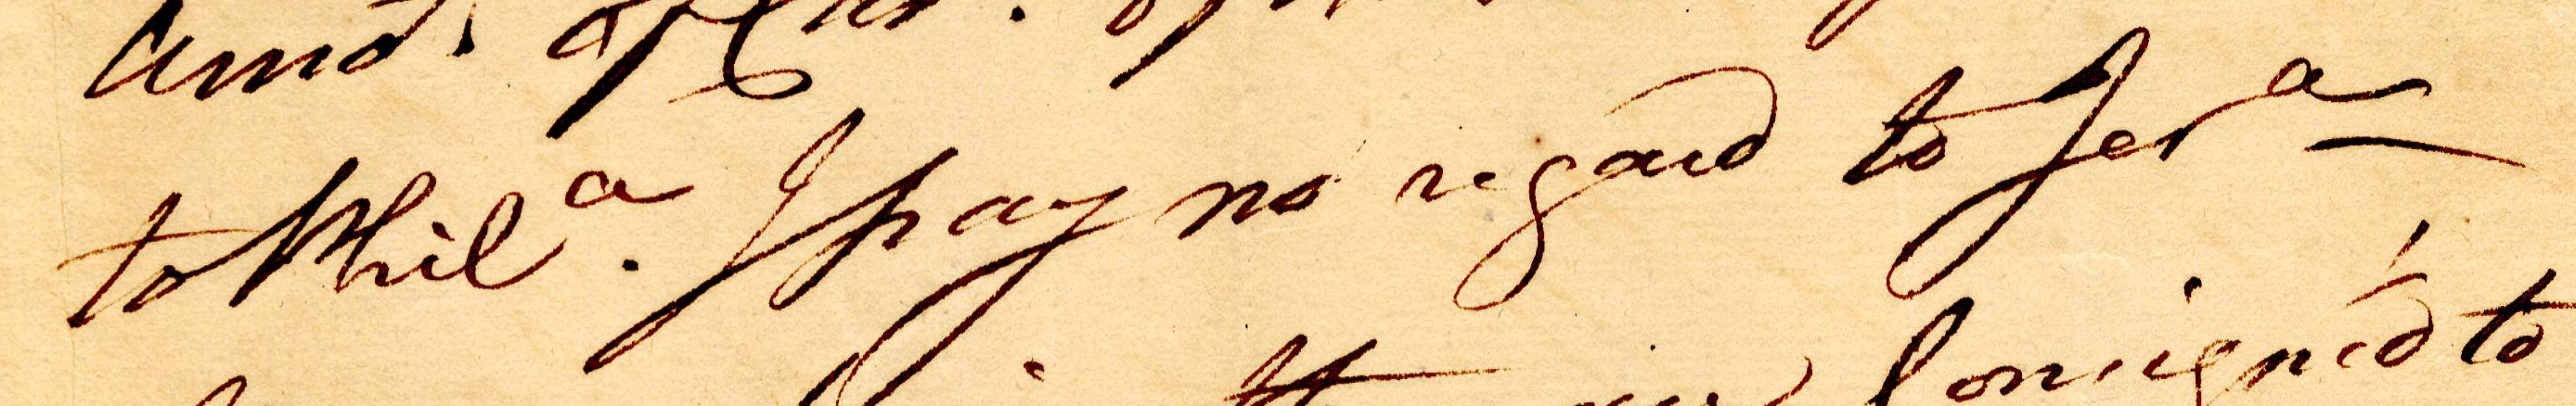to Phil^a I pay no regard to Jer^a.,
